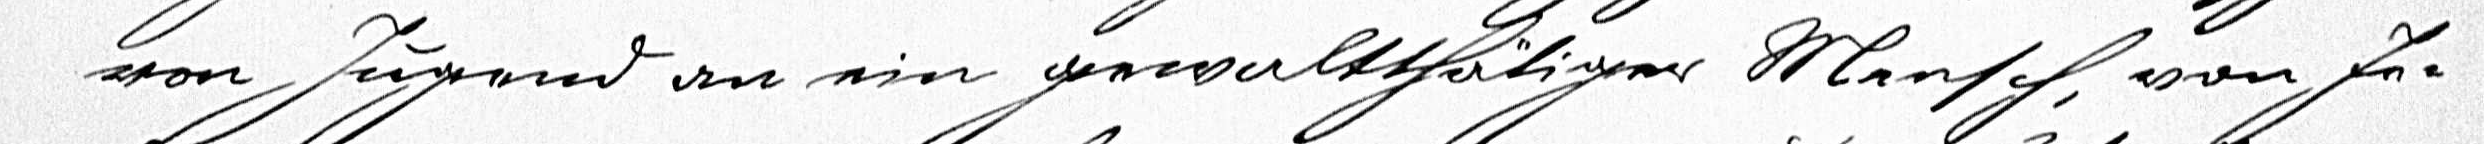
von Jugend an ein gewaltthätiger Mensch, von Je¬
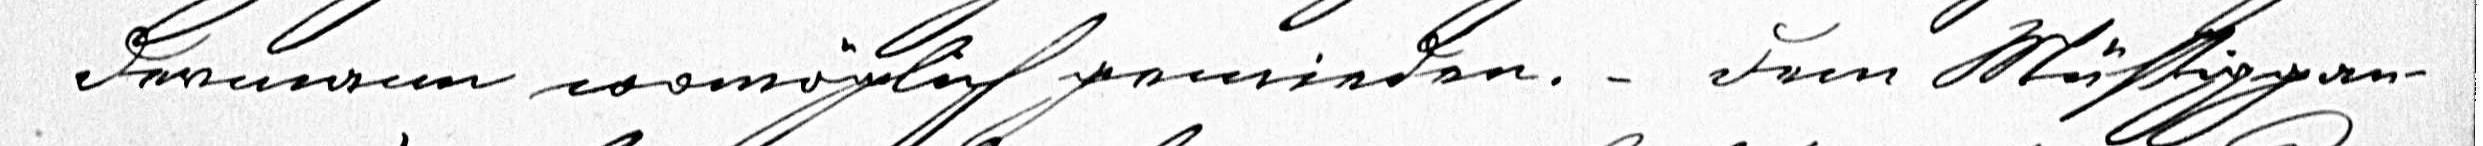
dermann womöglich gemieden. Dem Müßiggan¬
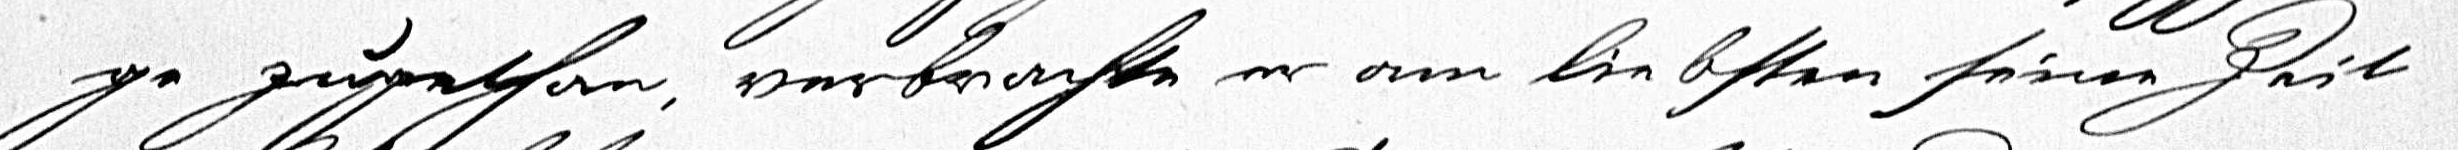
ge zugethan, verbrachte er am liebsten seine Zeit
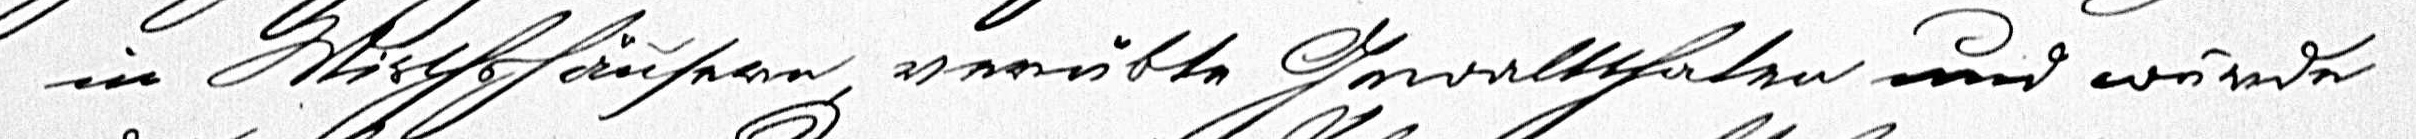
in Wirthshäusern, verübte Gewaltthaten du wurde
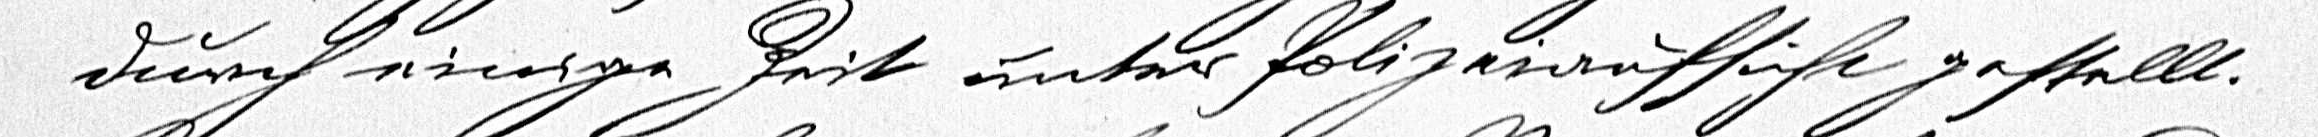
durch einige Zeit unter Polizeiaufsicht gestellt.
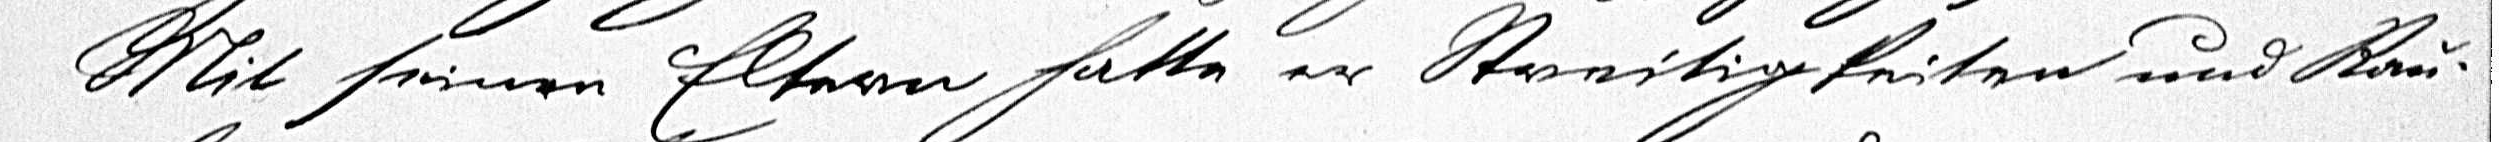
Mit seinen Eltern hatte er Streitigkeiten und Rau¬
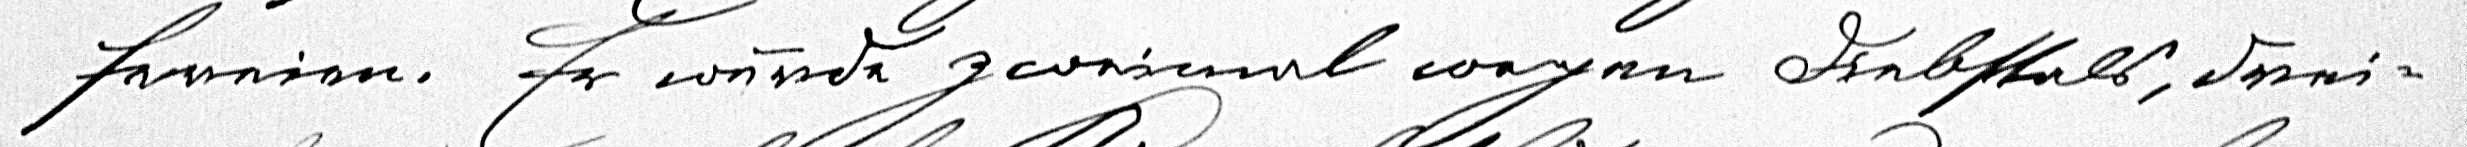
fereien. Er wurde zweimal wegen Diebstals, drei¬
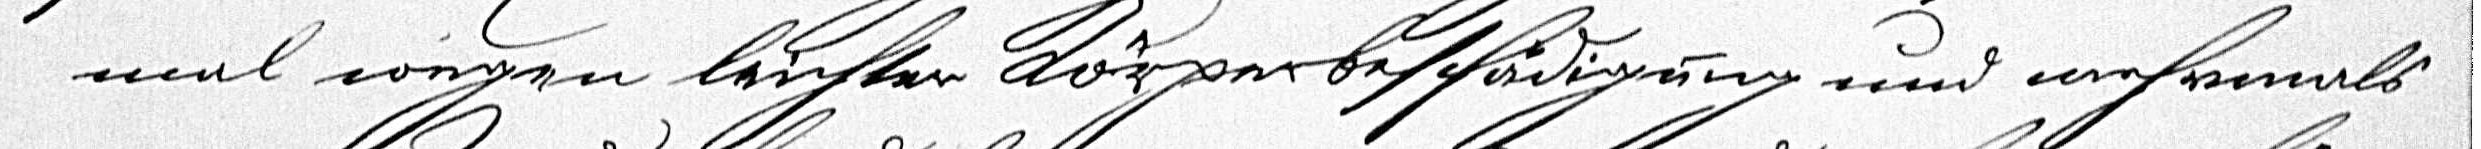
mal wegen leichter Körperbeschädigung und mehrmals
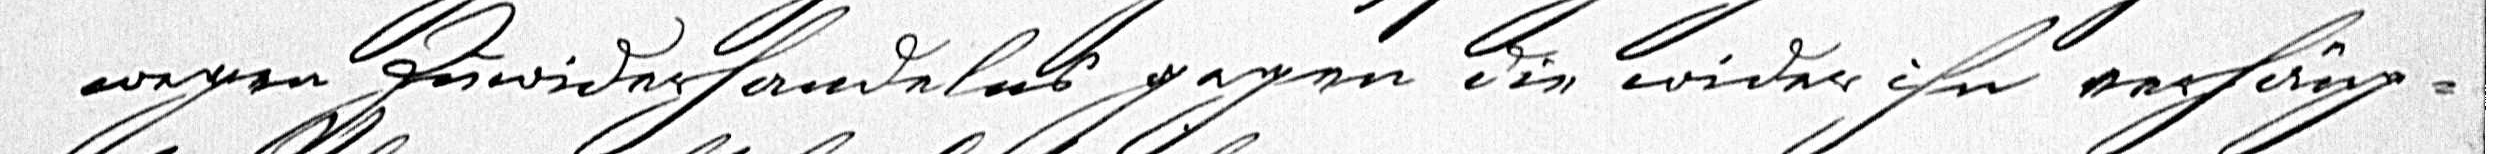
wegen Zuwiderhandelns gegen die wider ihn verhäng¬
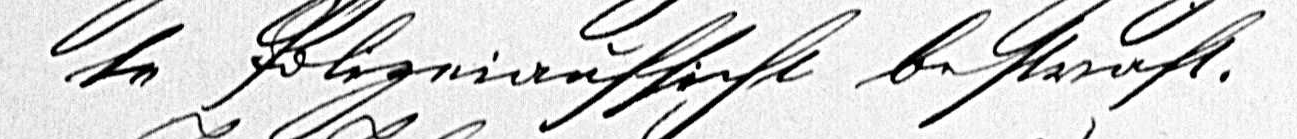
te Polizeiaufsicht bestraft.
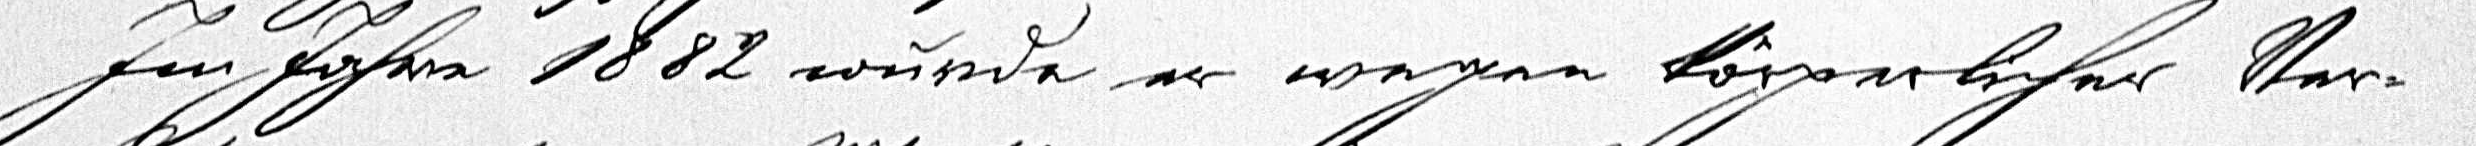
Im Jahre 1882 wurde er wegen körperlicher Ver¬
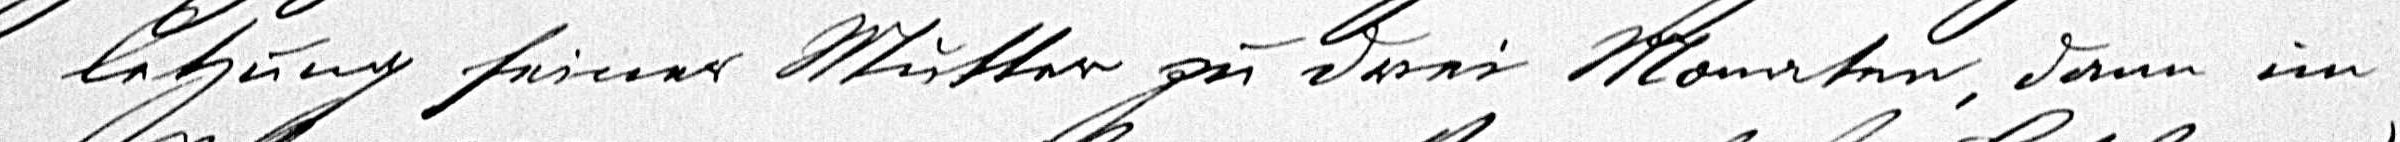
letzung seiner Mutter zu drei Monaten, dann im
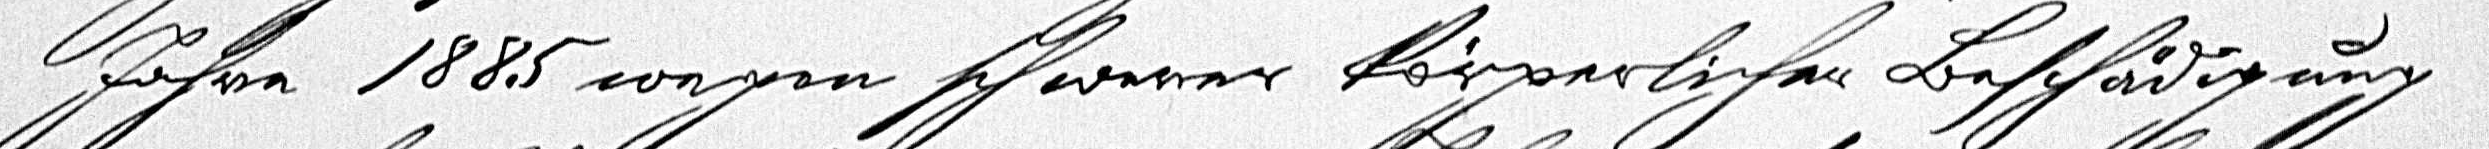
Jahre 1885 wegen schwerer körperlicher Beschädigung
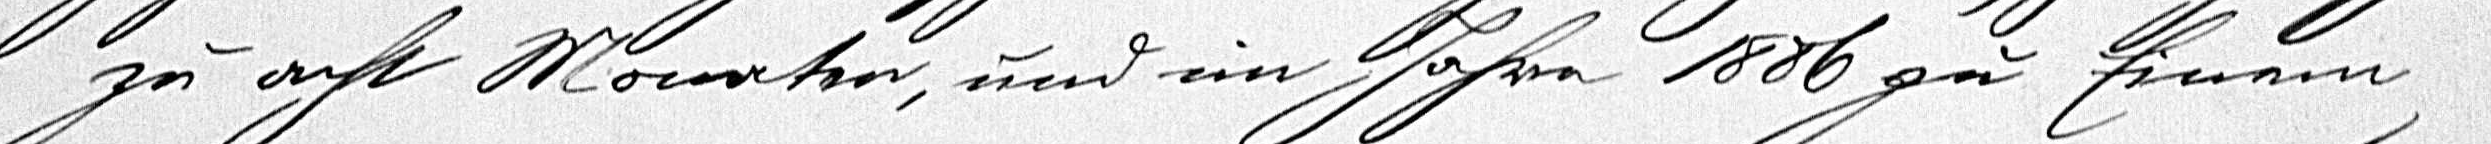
zu acht Monaten, und im Jahre 1886 zu Einem
